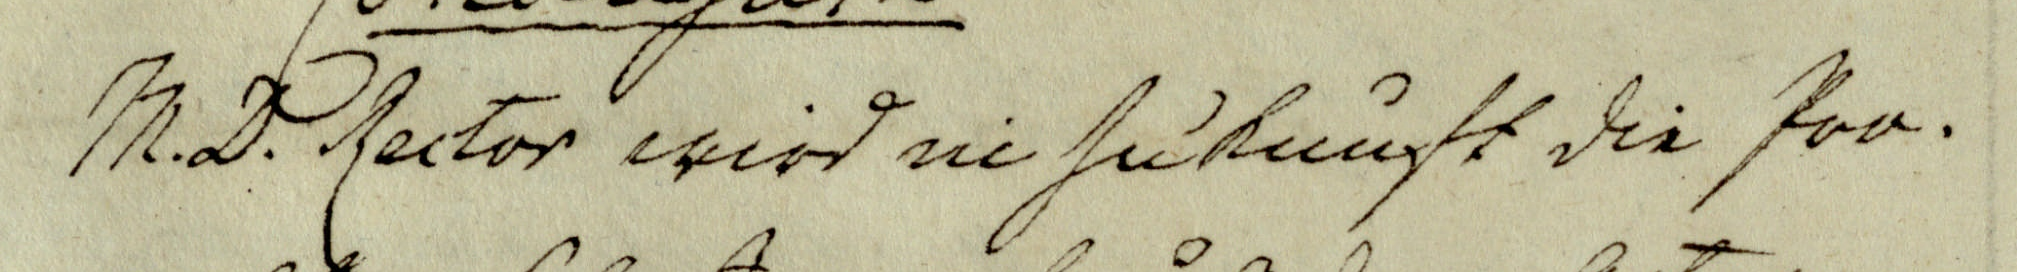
M. D. Rector wird in Zukunft die Pro¬
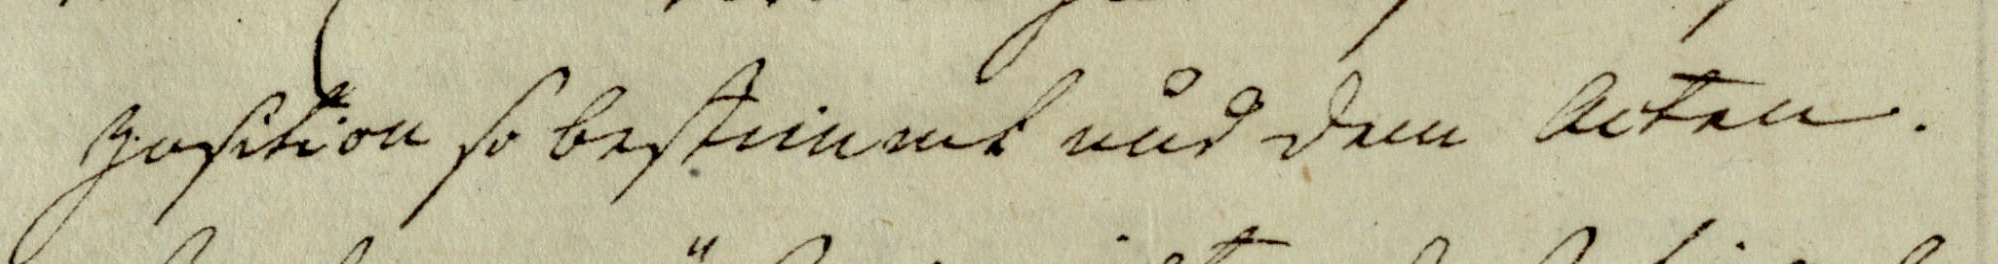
position so bestimmt und dem Acten¬
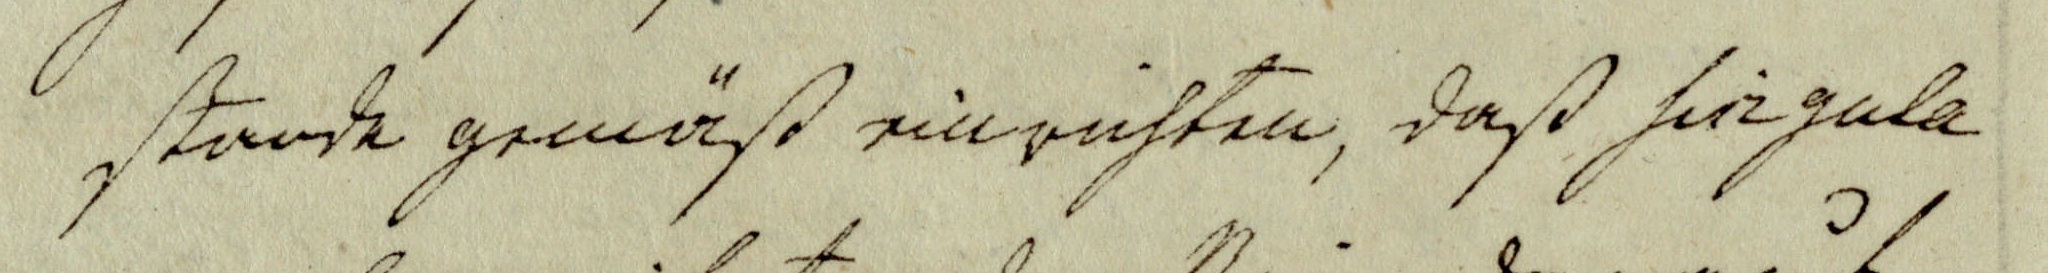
stande gemäß einrichten, daß singula
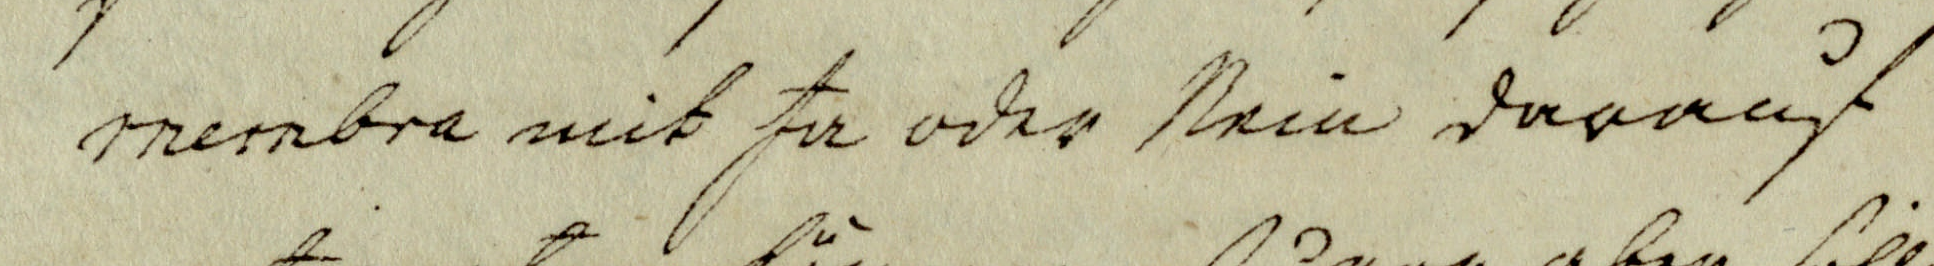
membra mit Ja oder Nein darauf
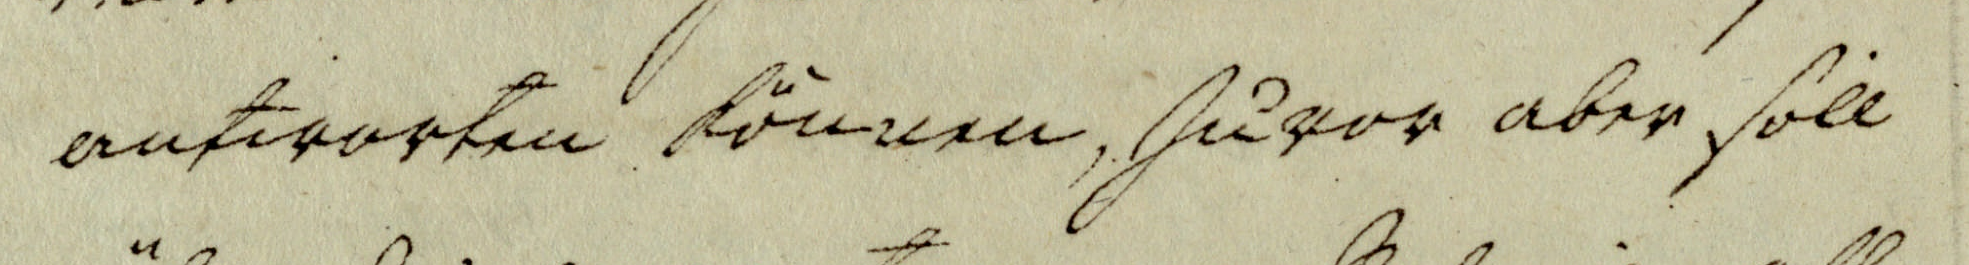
antworten können, zuvor aber soll
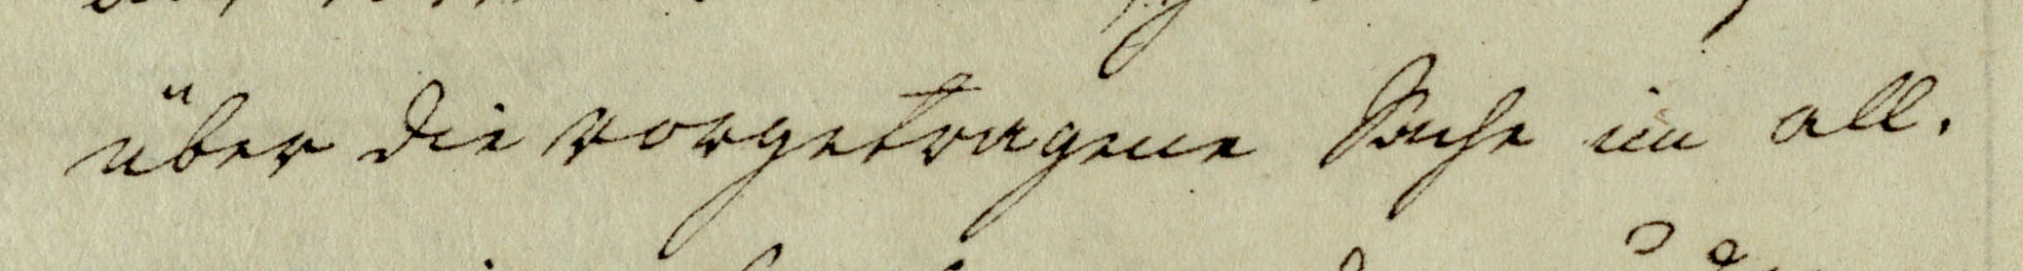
über die vorgetragene Sache im all¬
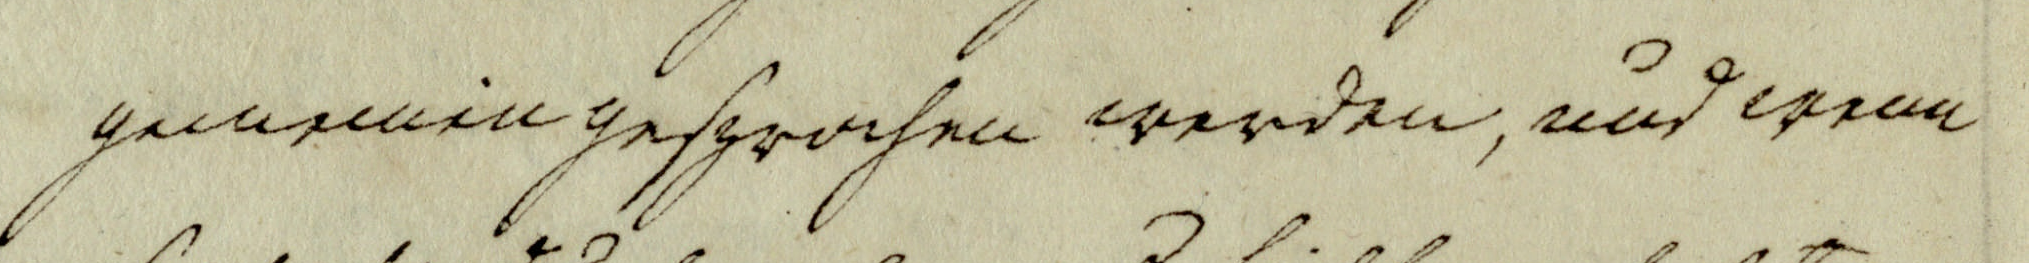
gemeinen gesprochen werden, und wenn
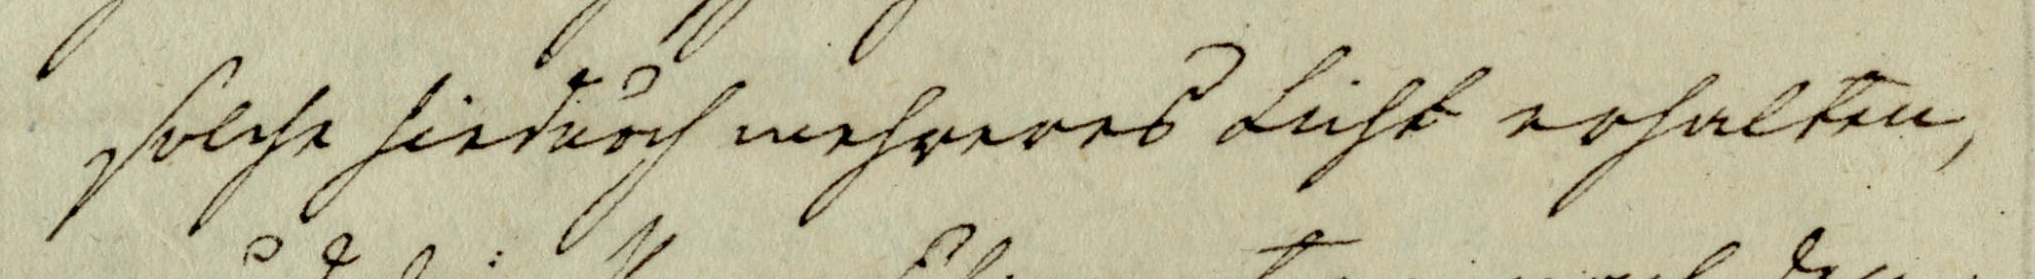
solche hiedurch mehreres Licht erhalten,
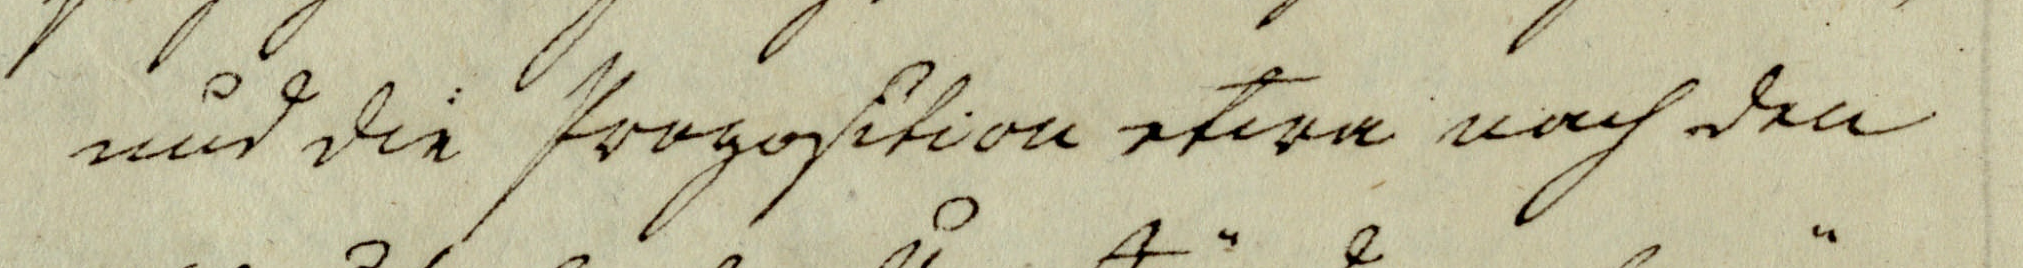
und die Proposition etwa nach den
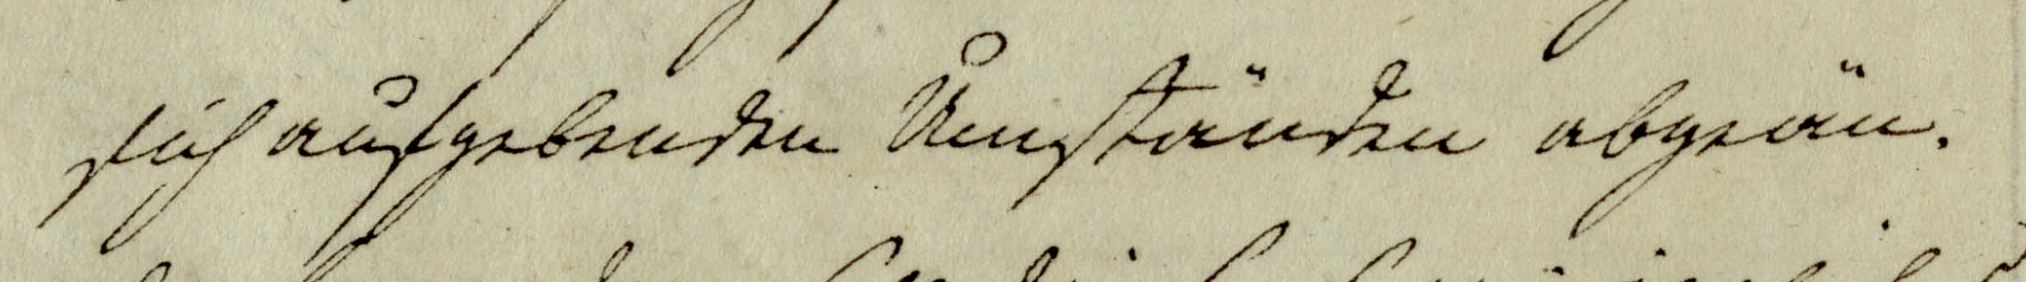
sich aufgebenden Umständen abgeän¬
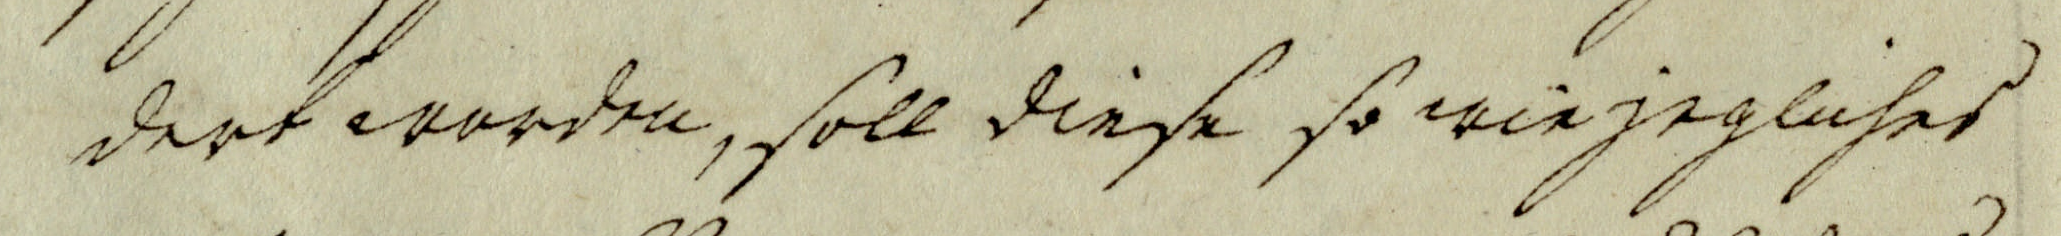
dert worden, soll diese so wie jegliches
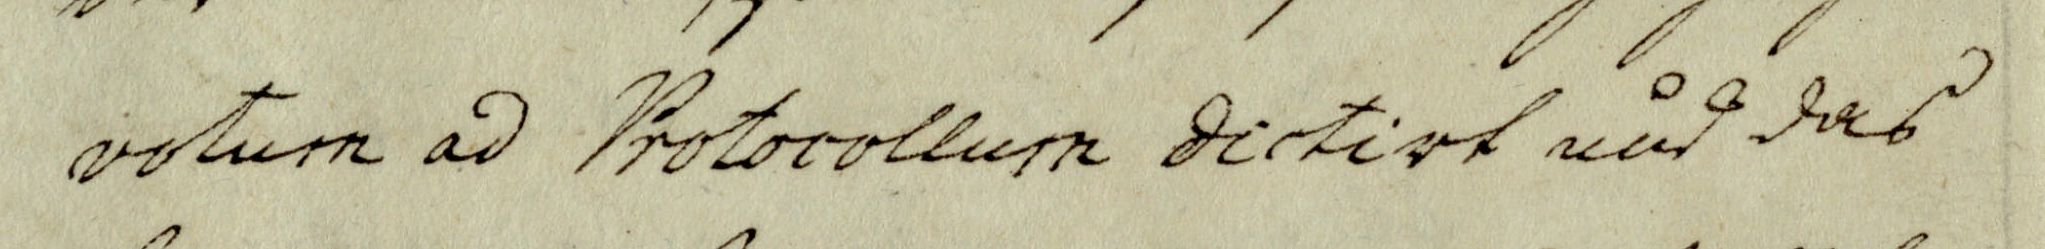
votum ad Protocollum dictirt und das
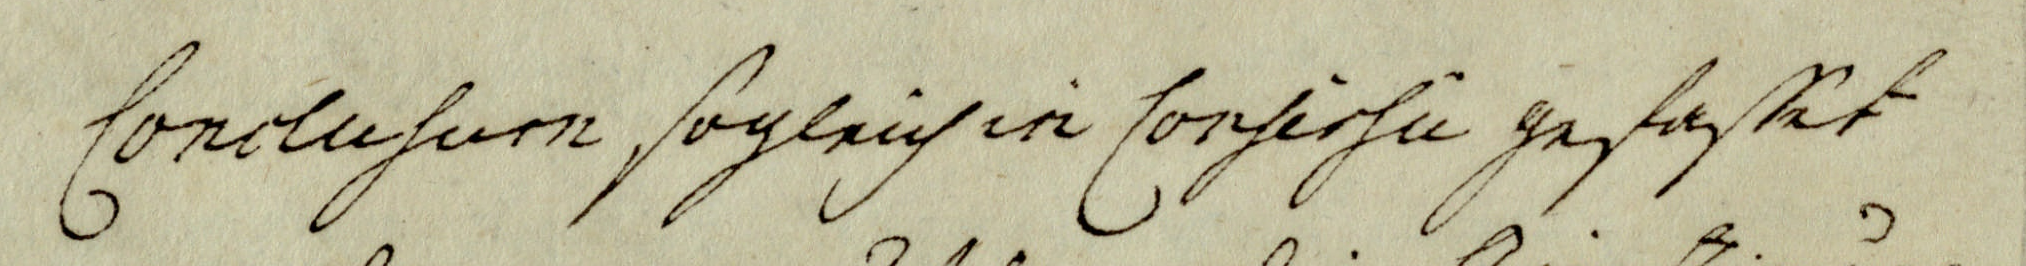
Conclusum sogleich in Consessu gefasset
